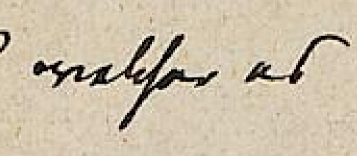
welcher es
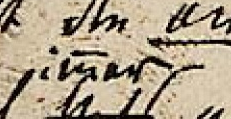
imer
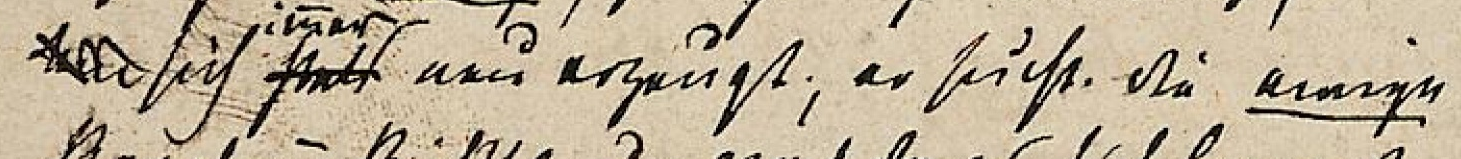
den sich stets neu erzeugt, er sucht die ewige
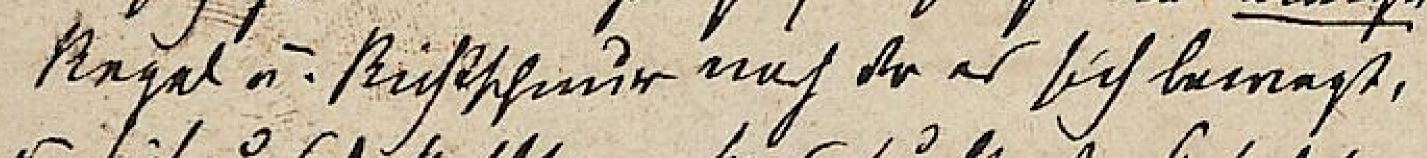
Regel u. Richtschnur nach dr es sich bewegt,
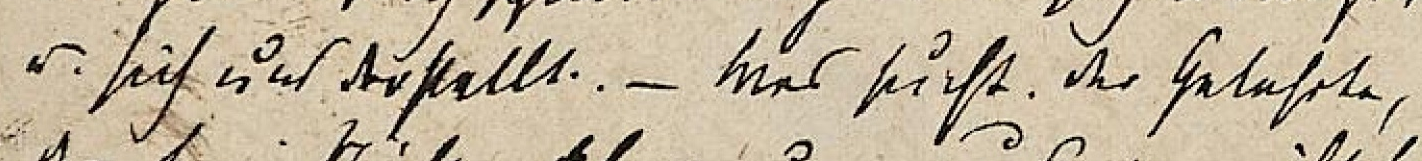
u sich uns darstellt. _ Was sucht der Gelehrte,
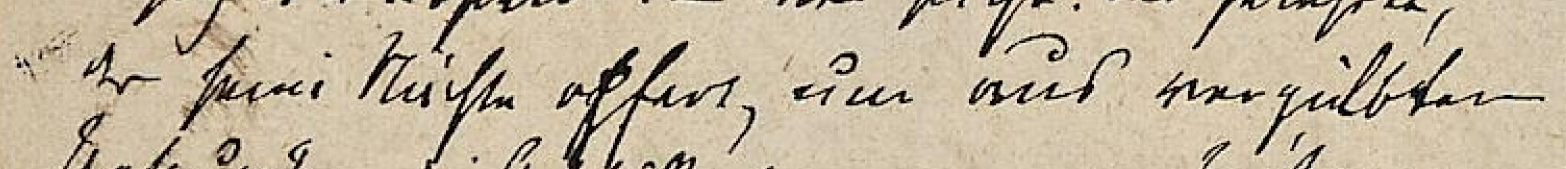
der seine Nächte opfert, um aus vergilbten
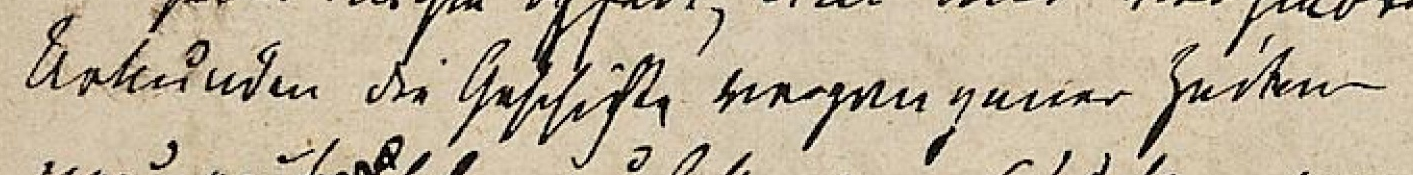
Urkunden die Geschichte vergangener Zeiten
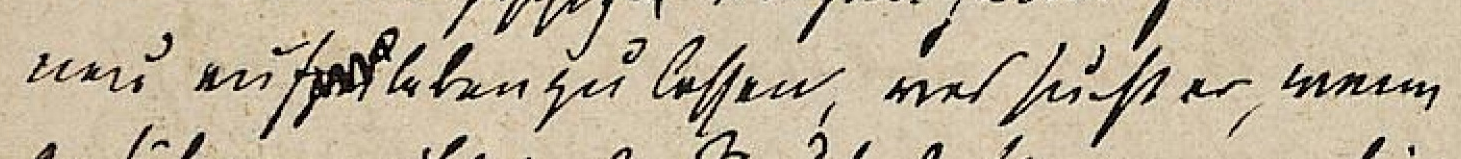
neu aufzuleben zu lassen, was sucht er, wenn
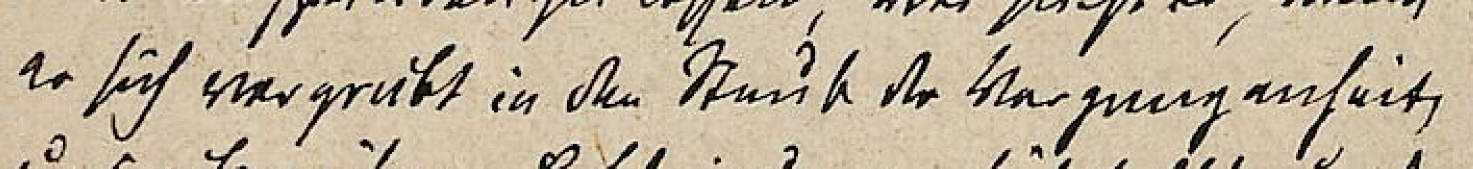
er sich vergräbt in dem Staub der Vergangenheit,
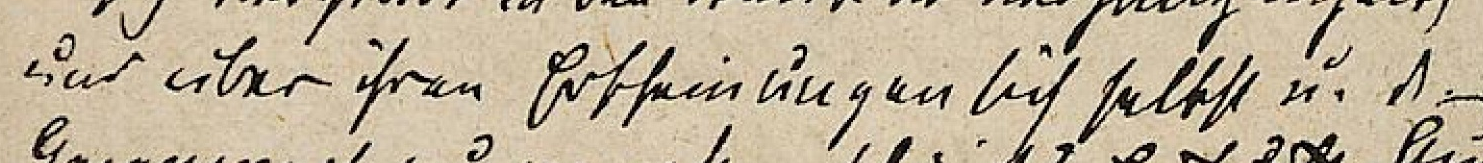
und über ihren Erscheinungen sich selbst u. d.
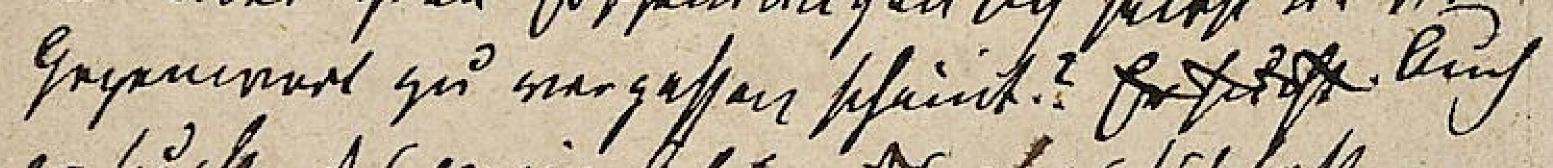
Gegenwart zu vergessen scheint? Er sucht. Auch
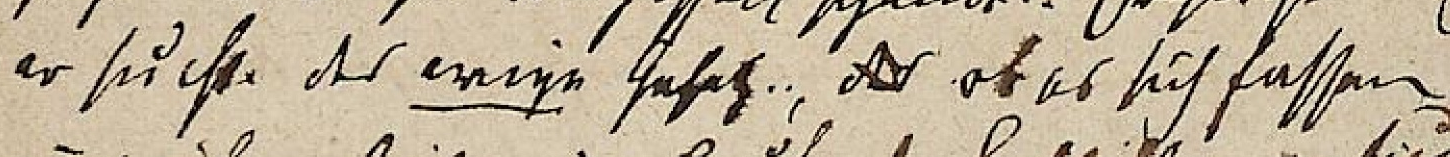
er sucht das ewige Gesetz.., das or es sich fassen
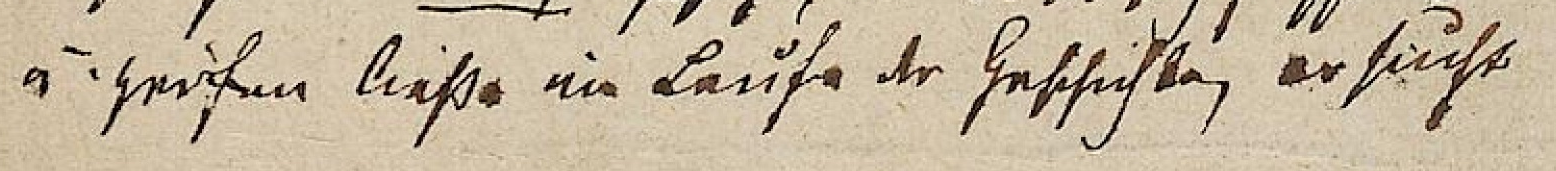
u. ziehen ließe im Laufe der Geschichte, er sucht
